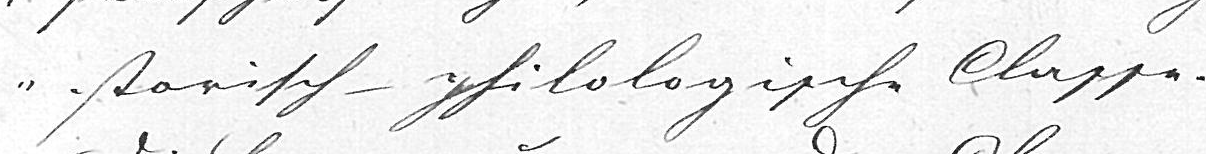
" storisch-philologischen Classe.
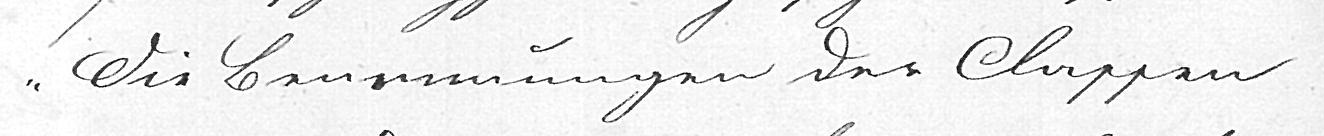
" Die Benennungen der Classen
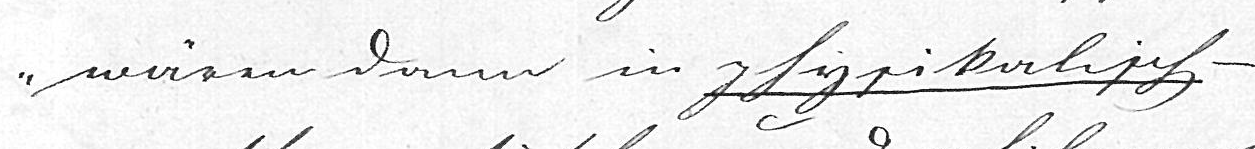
" wären dann in physikalisch-
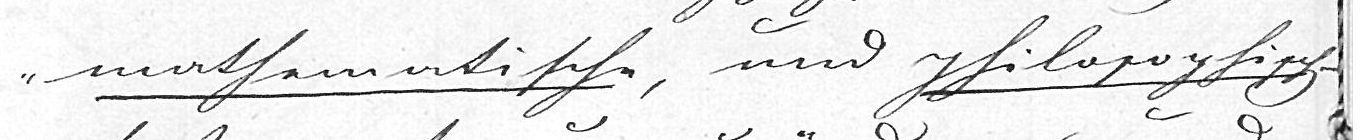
" mathematische- und philosophisch-
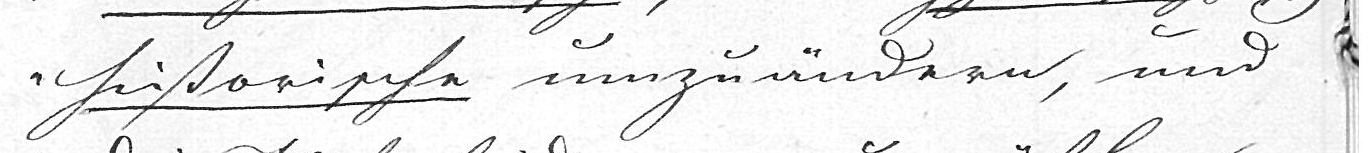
" historische unzuändern, und
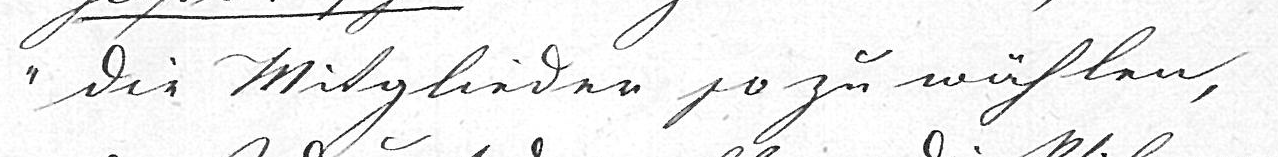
" die Mitglieder so zu wählen,
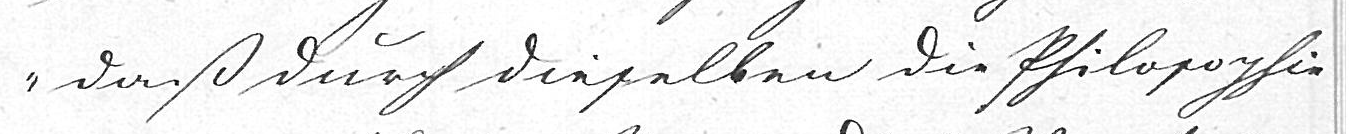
" daß durch dieselben die Philosophie
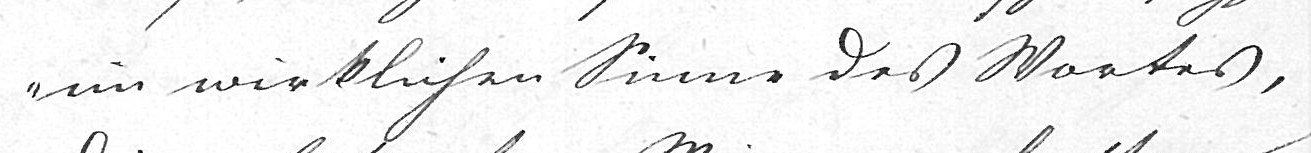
" im wirklichen Sinne des Worte,
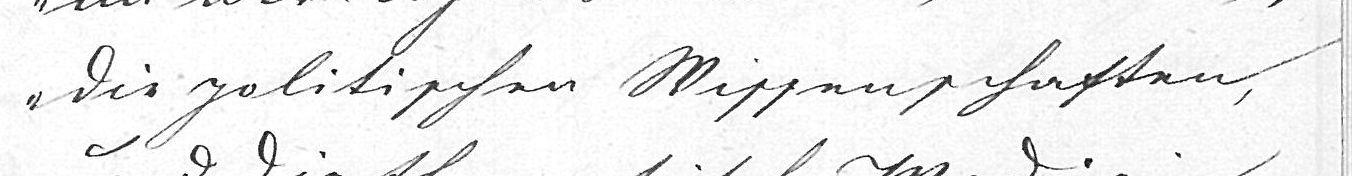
" die politischen Wissenschaften,
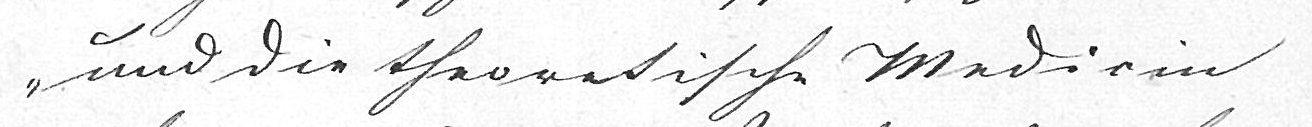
" und die theoretische Medicin
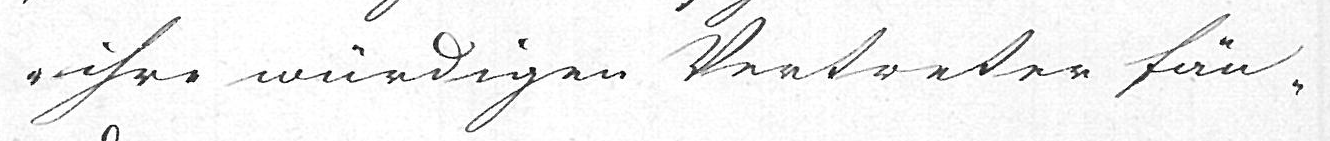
" ihre würdigen Vertreter fän-
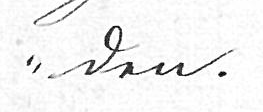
" den.
